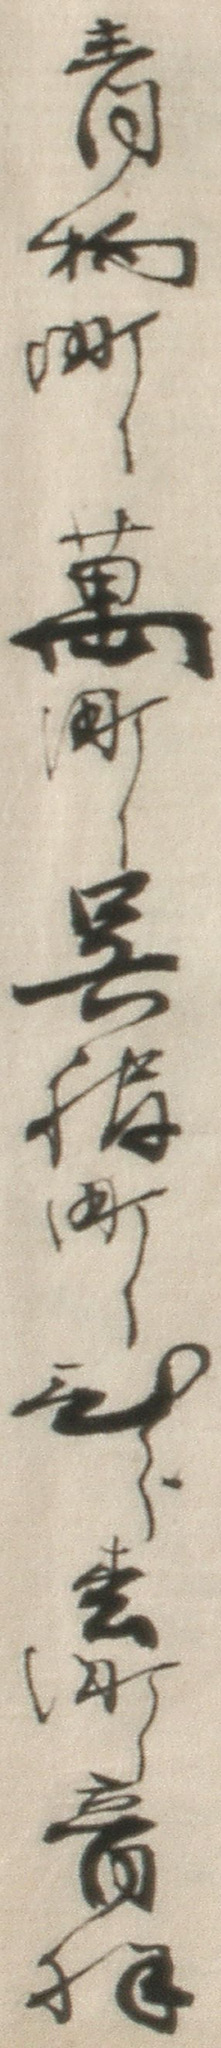青物町萬町呉服町ひら松町音羽
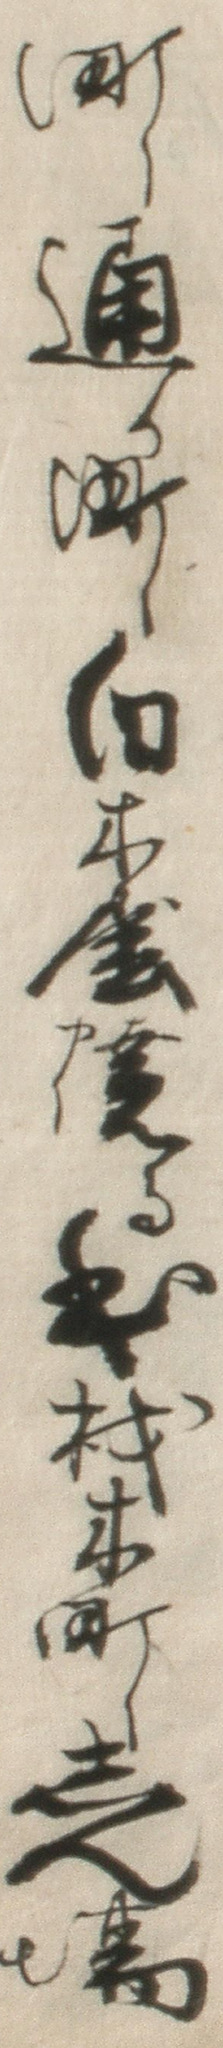町通り町白木屋焼る本材木町売場
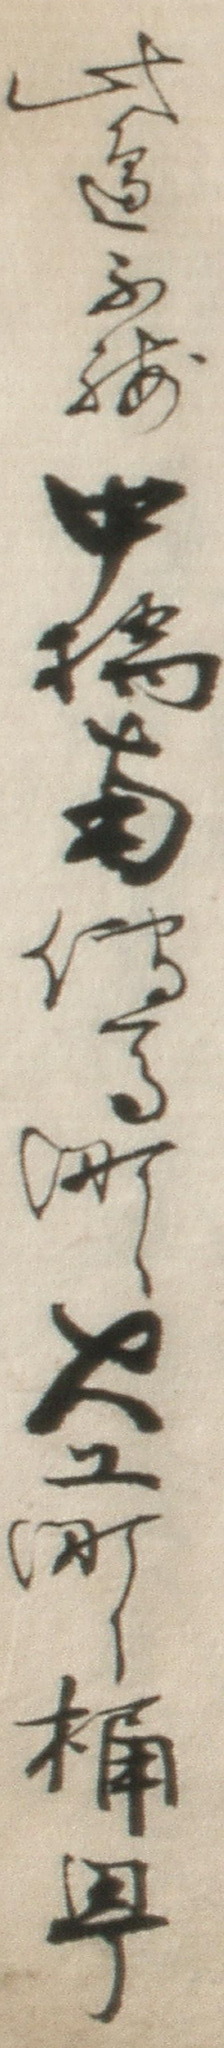此辺不残中橋南伝馬町大工町桶町
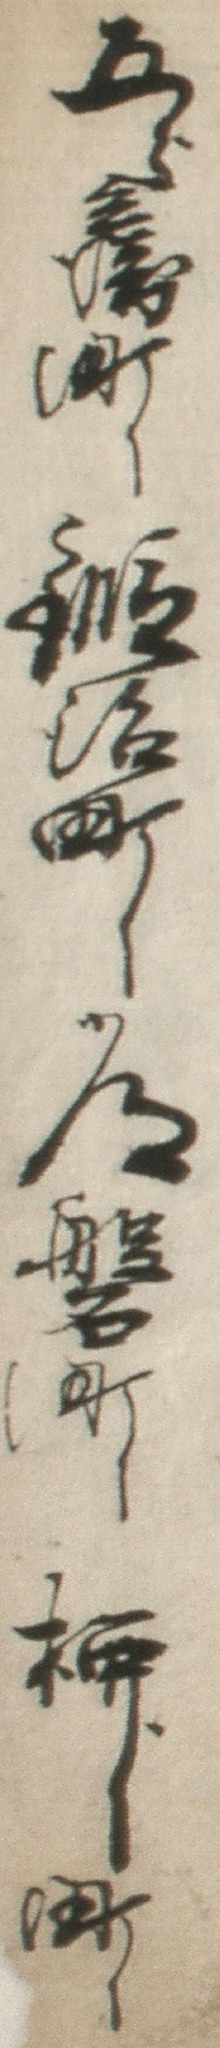五郎兵衛町鍛冶町常盤町柳町

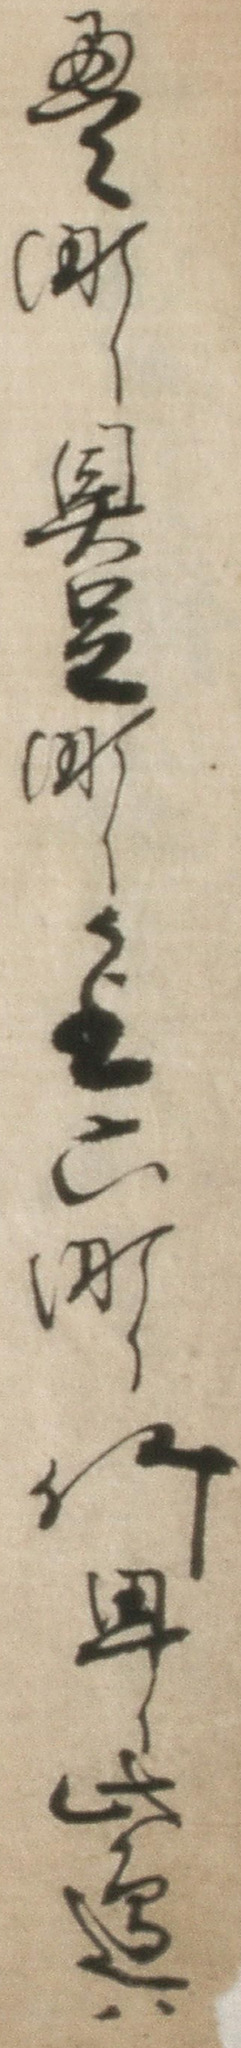畳町具足町金六町竹町此辺ハ
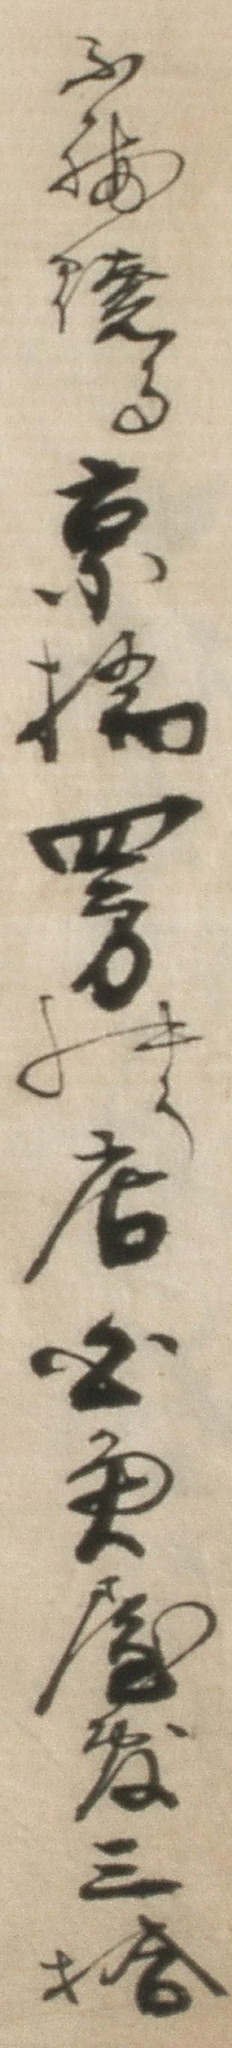不残焼る京橋四方の店白魚屋敷三拾
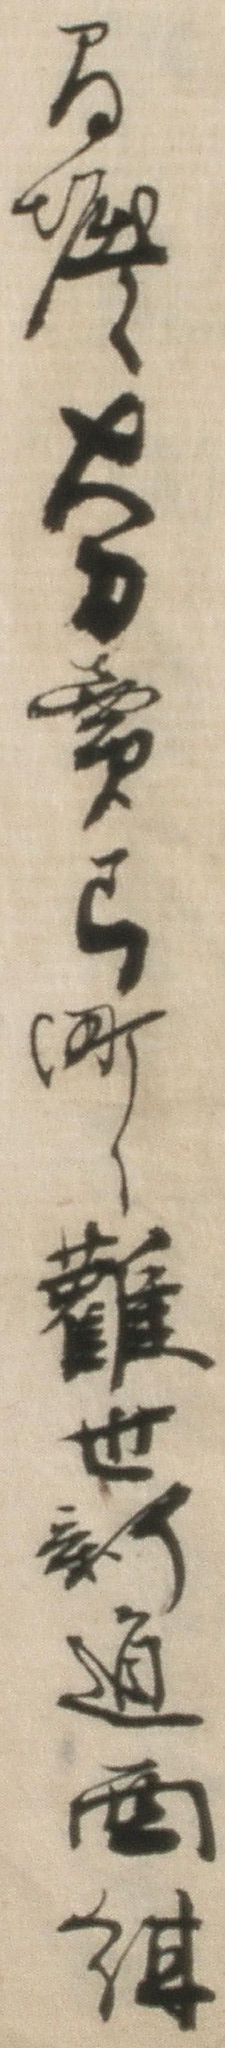間堀大刀売弓町観世新通西紺
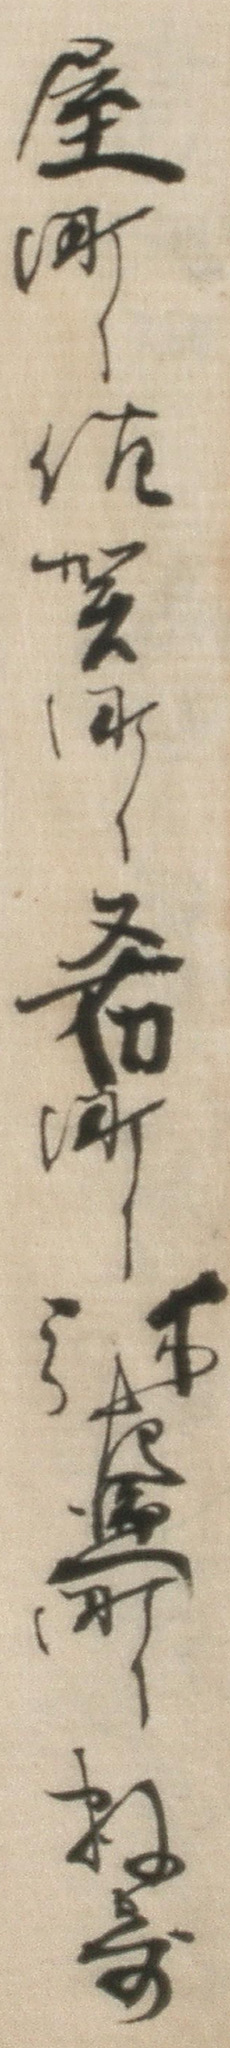屋町佐賀町肴町弥左衛門町数寄
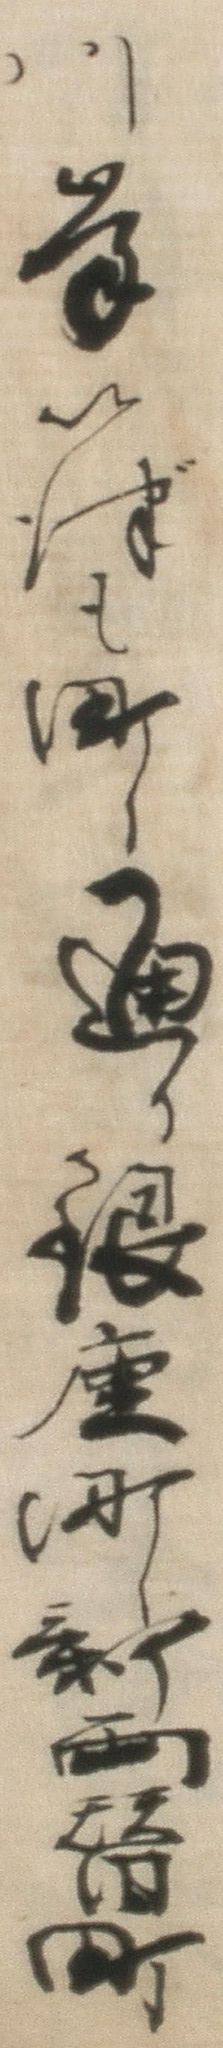川岸いづも町通り銀座町新両替町
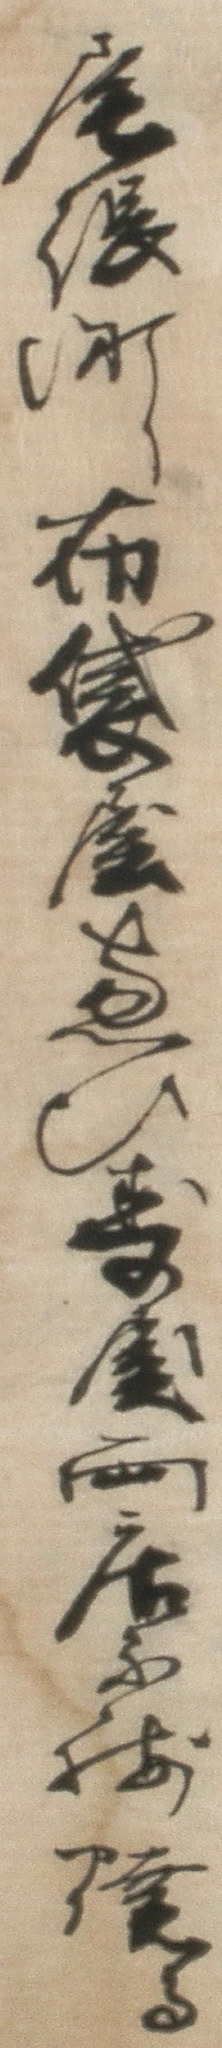尾張町布袋屋ゑひす屋両店不残焼る
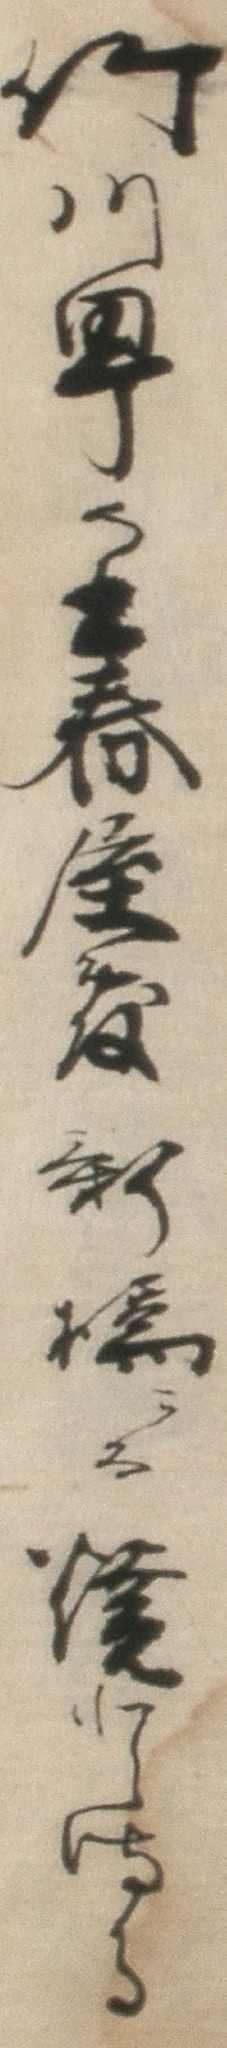竹川町金春屋敷新橋二而焼とまる
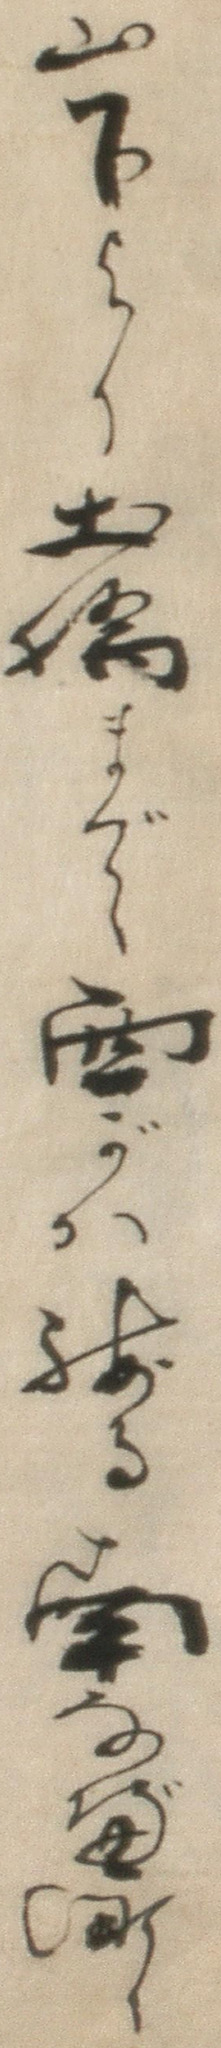山下より土橋まで西側残る南なべ町
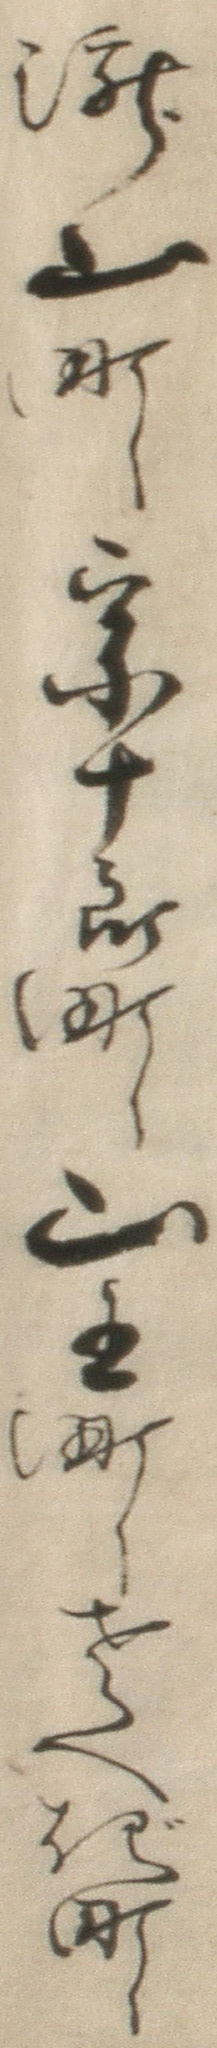瀧山町宗十郎町山王町さへぎ町
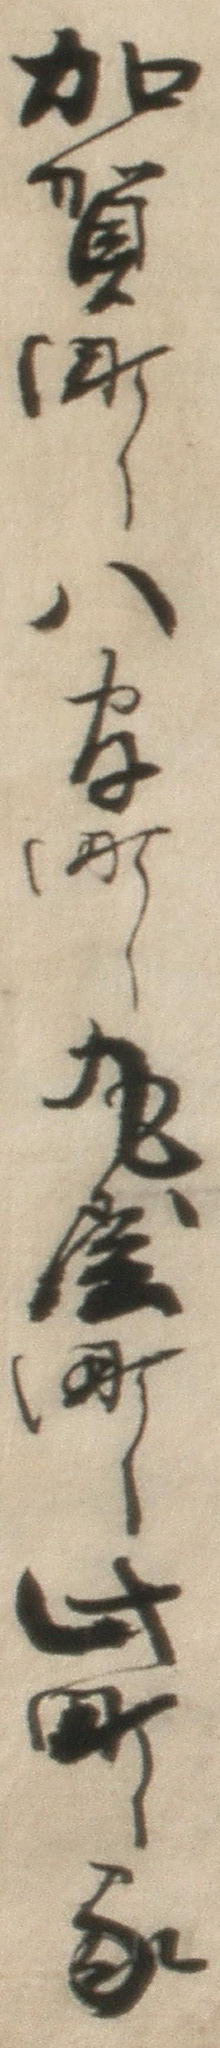加賀町八官町丸屋町此町家
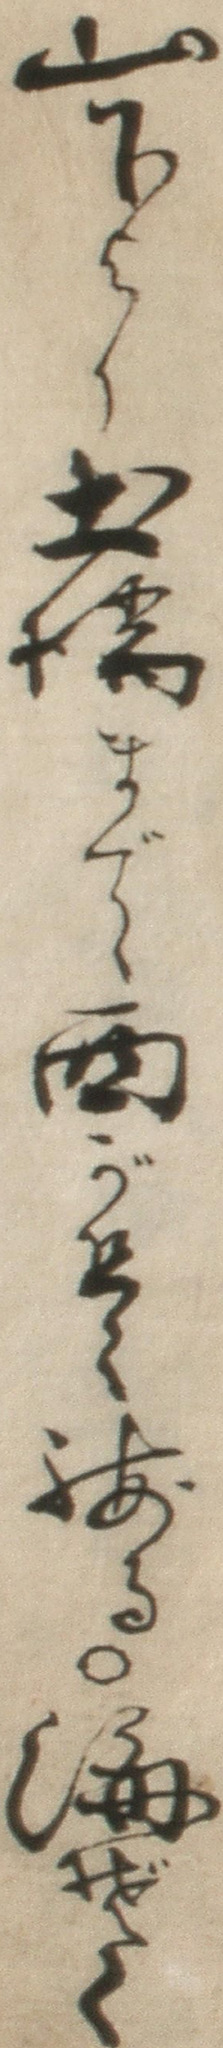山下より土橋まで西がわ残る〇海ぞく

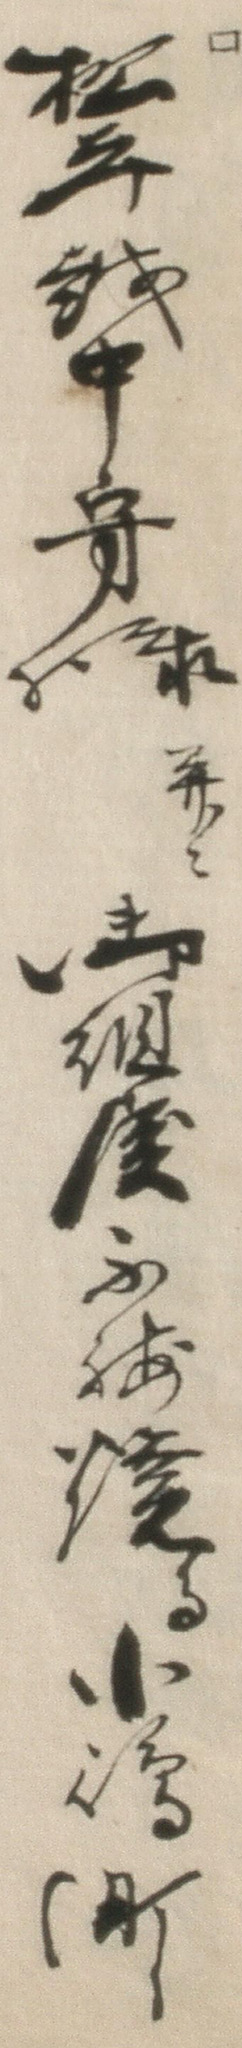▢松平越中守様并二御組屋不残焼る小嶋町
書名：文政十二丑としの類焼場所附
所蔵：東京大学地震研究所図書室 Earthquake Research Institute Library, The University of Tokyo, JAPAN
